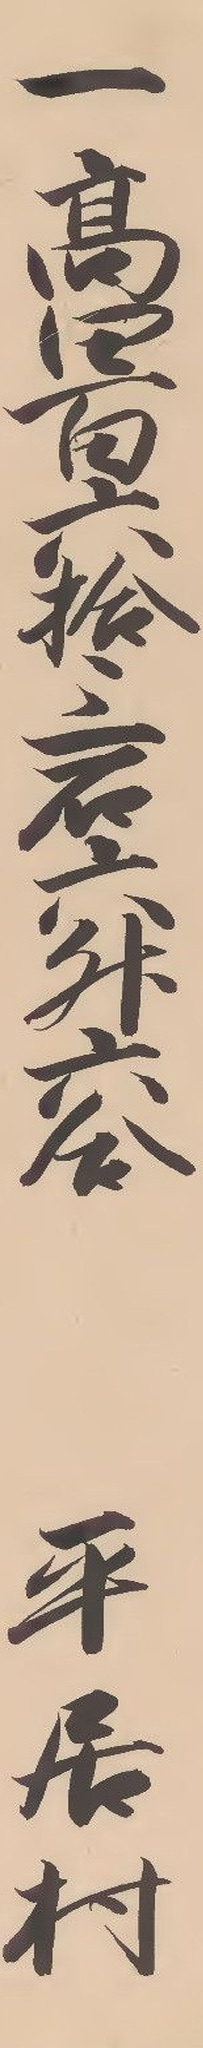一高四百六拾三石六升六合平居村
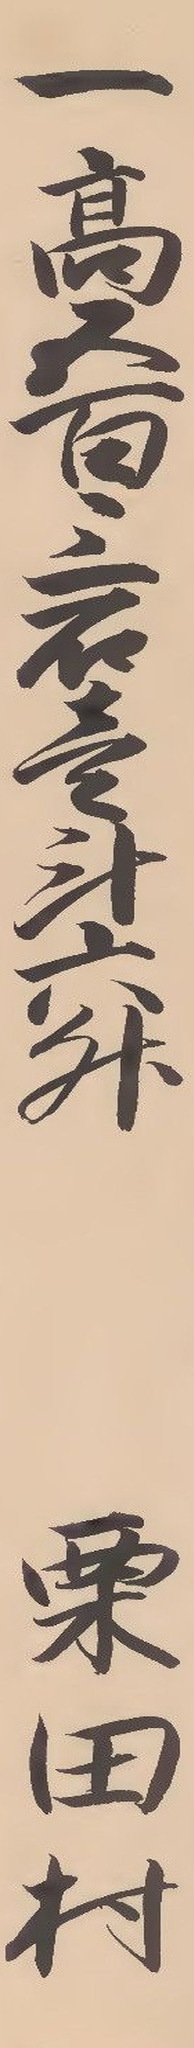一高五百三石壱斗六升栗田村
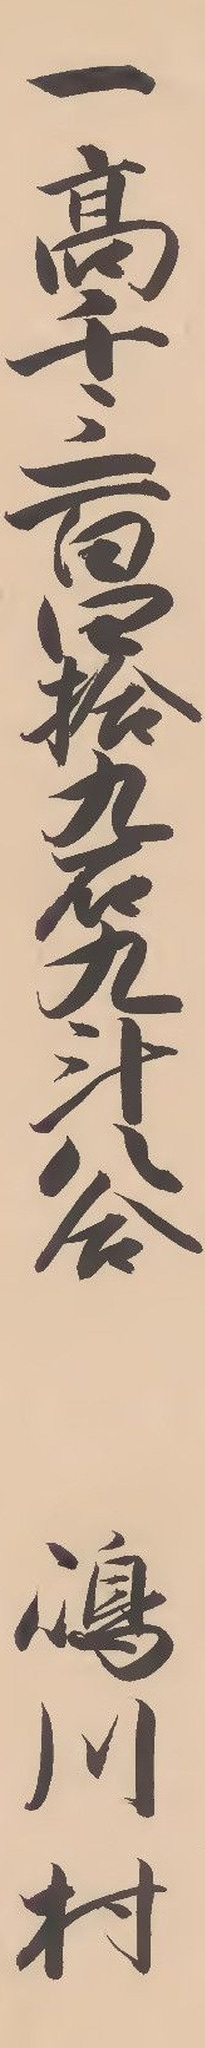一高千三百四拾九石九斗八合島川村

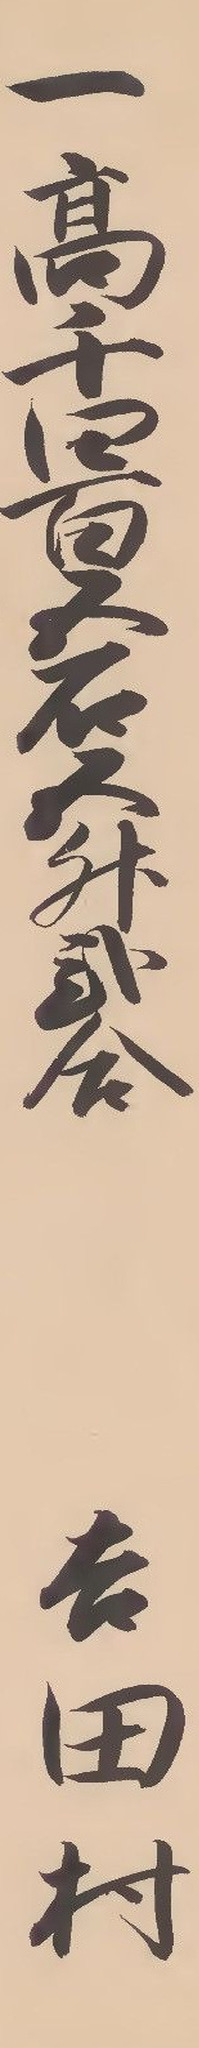一高千四百五石五升弐合吉田村
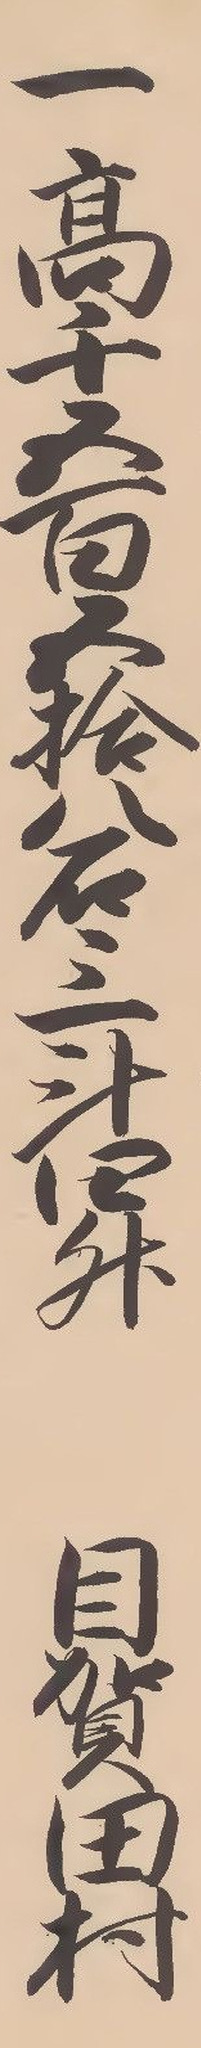一高千五百五拾八石三斗四升目賀田村
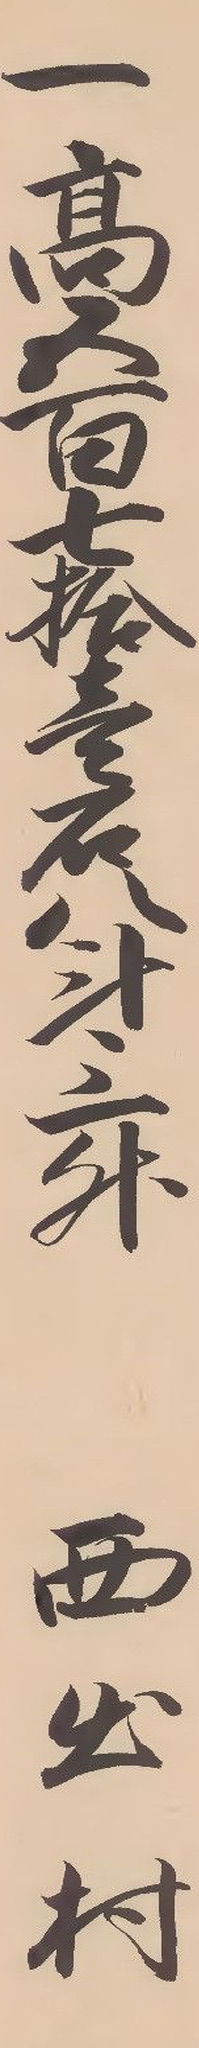一高五百七拾壱石八斗三升西出村
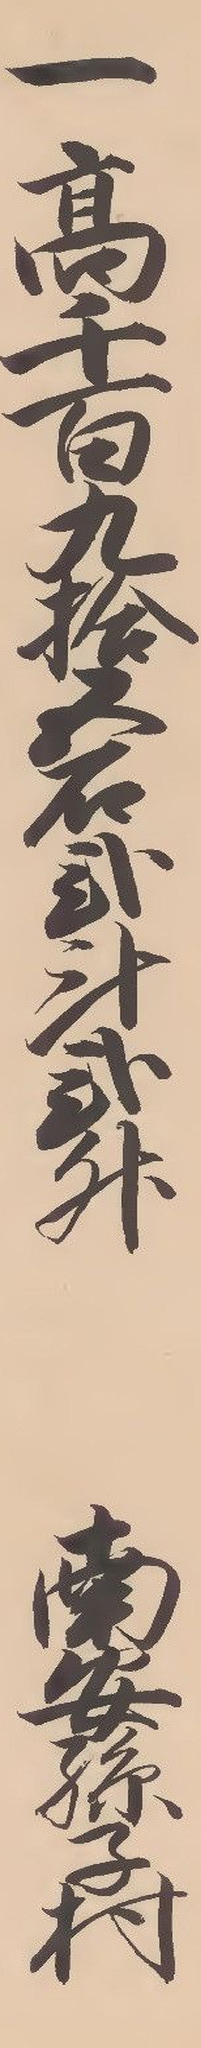一高千百九拾五石弐斗弐升南安孫子村
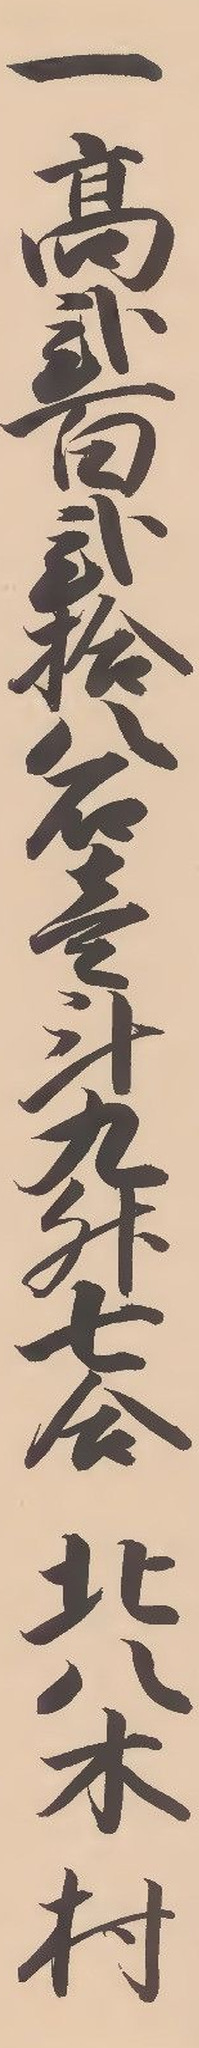一高弐百弐拾八石壱斗九升七合北八木村
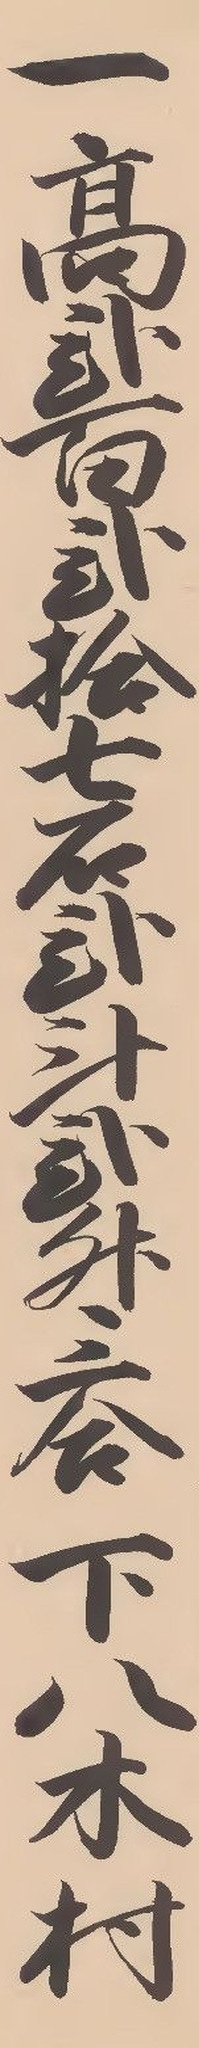一高弐百弐拾八石壱斗九升七合北八木村
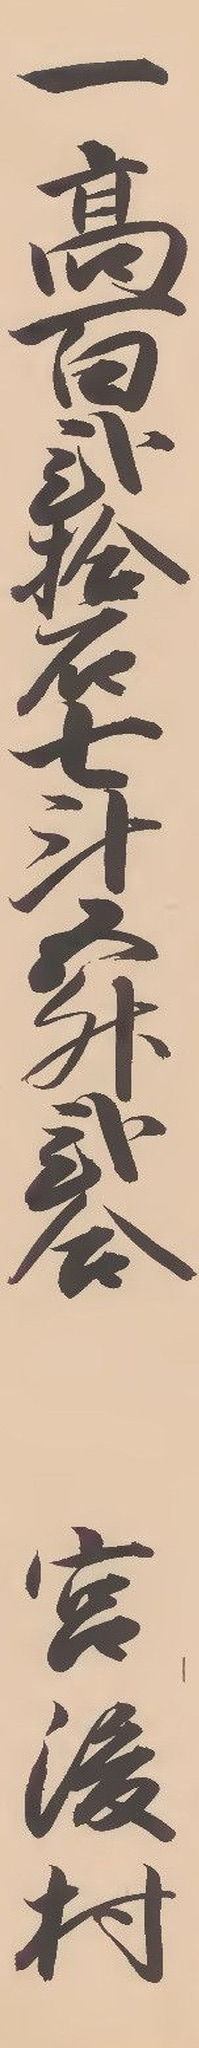一高百弐拾石七斗五升弐合宮後村

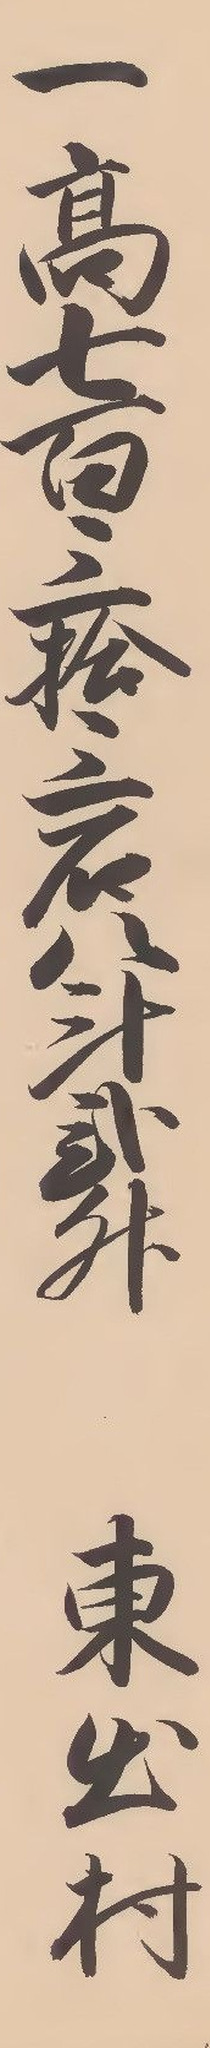一高七百三拾三石八斗弐升東出村
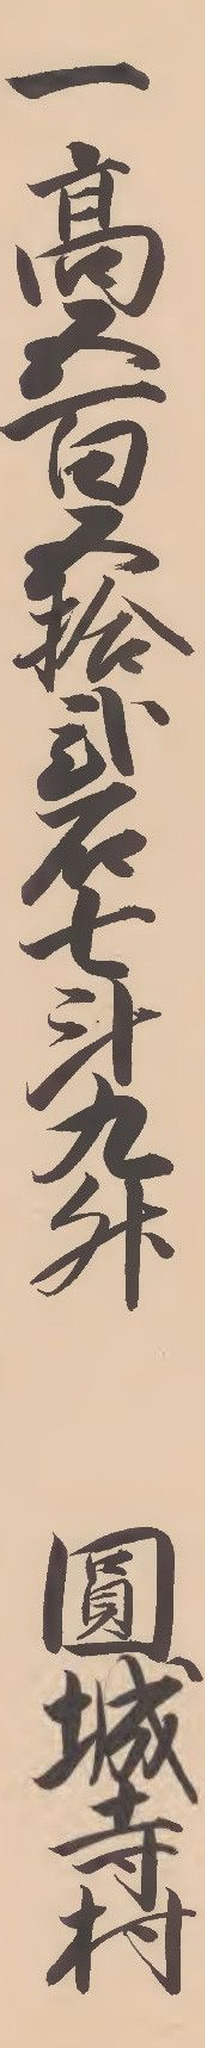一高五百五拾弐石七斗九升円城寺村
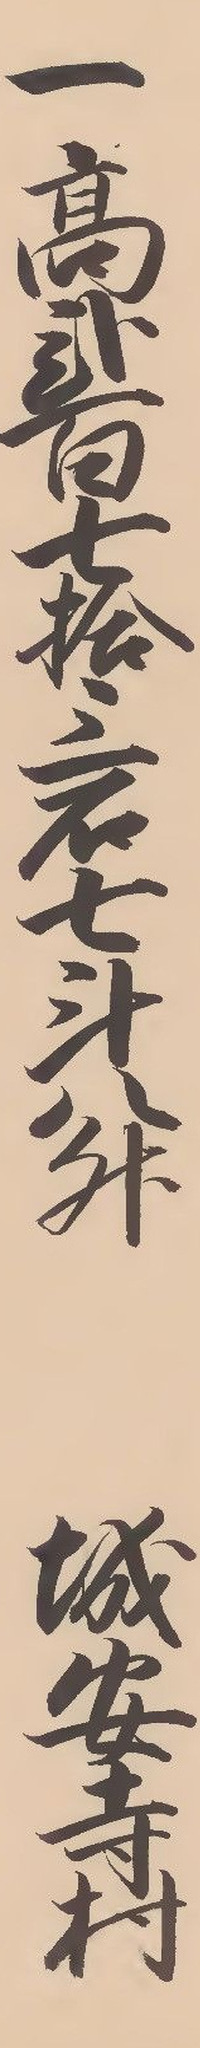一高弐百七拾三石七斗八升城安寺村
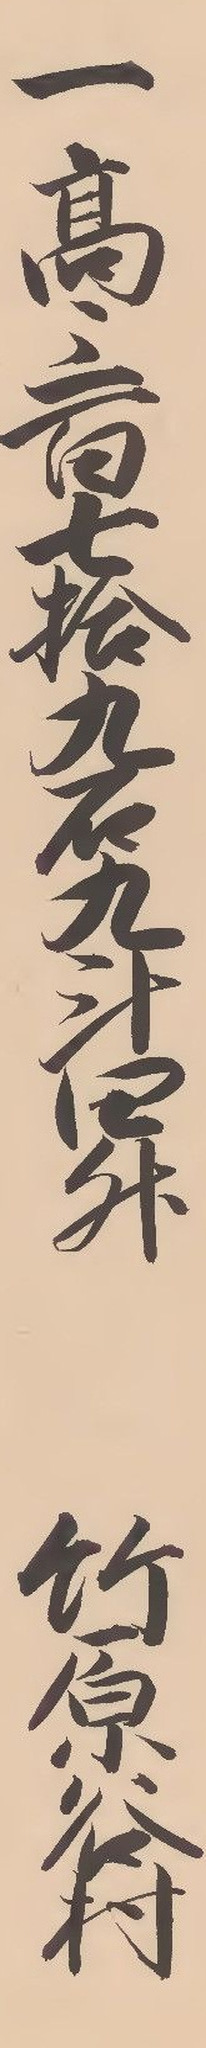一高三百七拾九石九斗四升竹原谷村
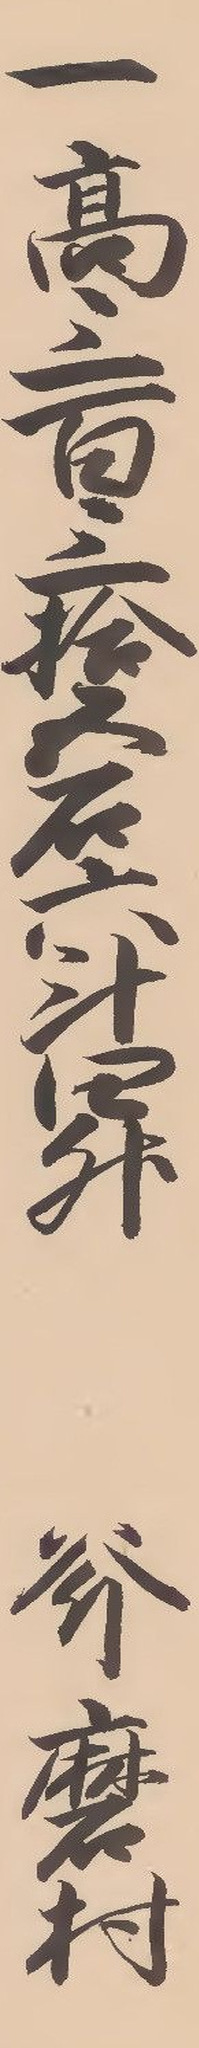一高三百三拾五石六斗四升斧磨村
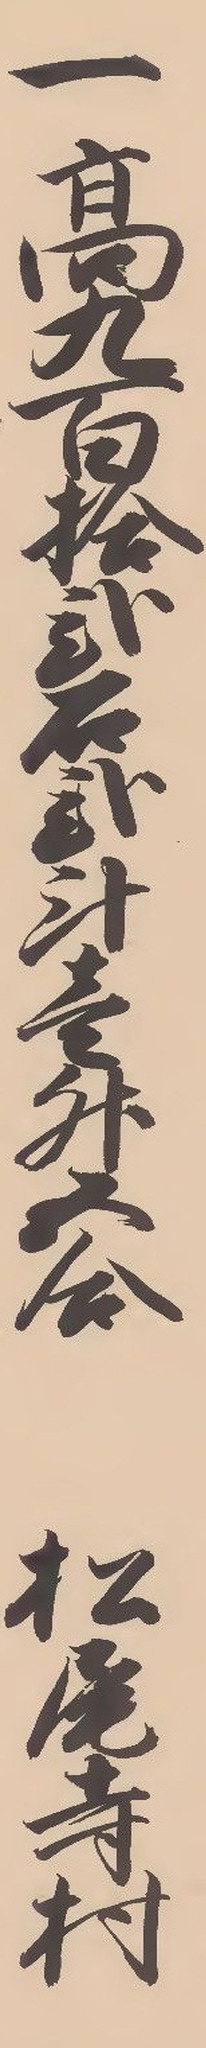一高九百拾弐石弐斗壱升五合松尾寺村
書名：近江国郷帳
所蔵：国立公文書館 National Archives of Japan
